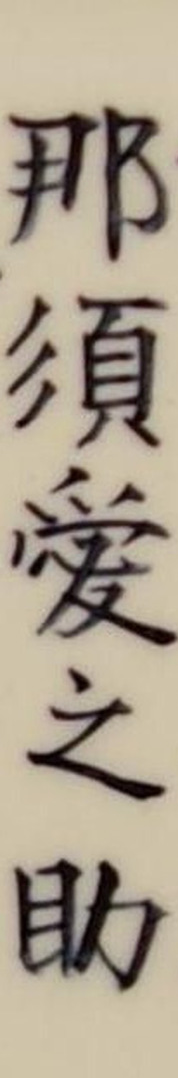那須愛之助
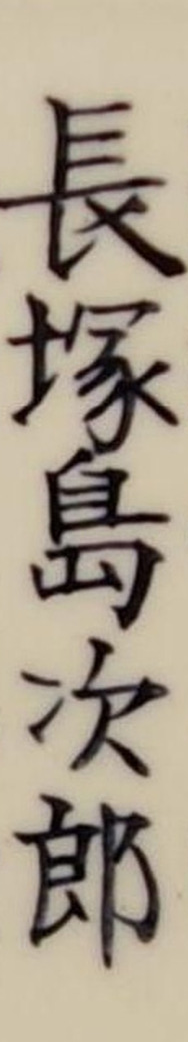長塚島次郎
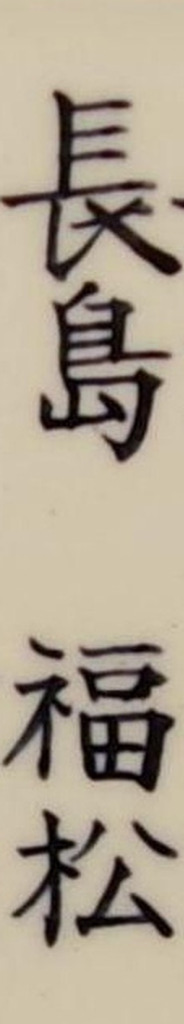長島福松
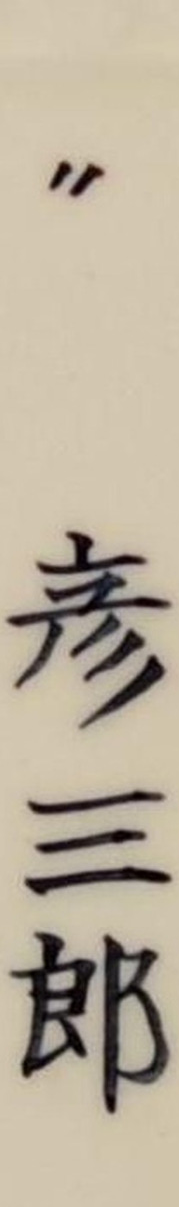彦三郎
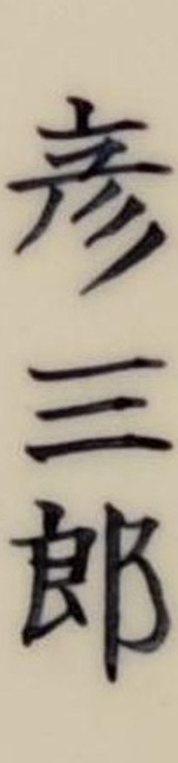彦三郎
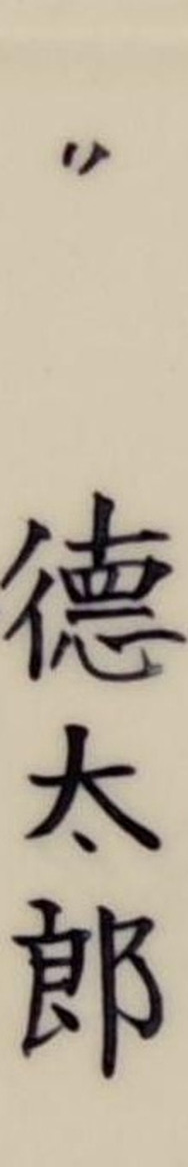徳太郎
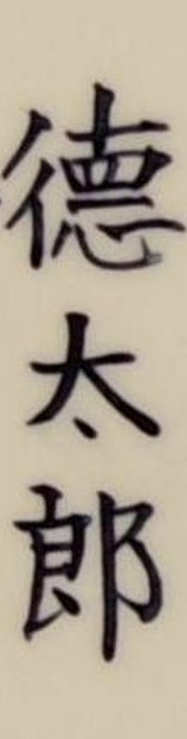徳太郎
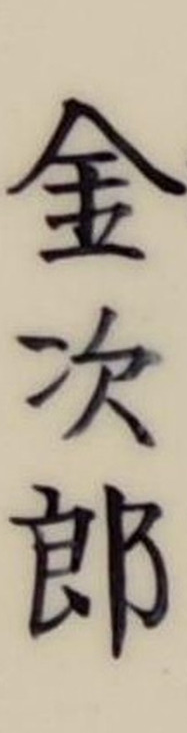金次郎
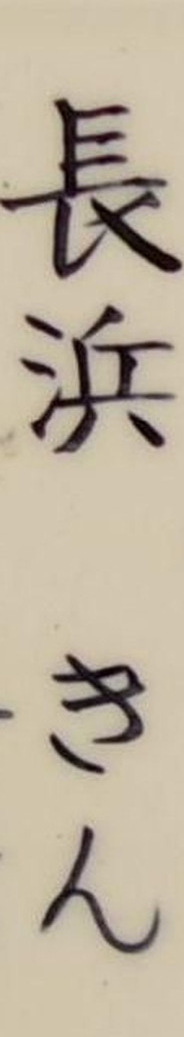長兵きん
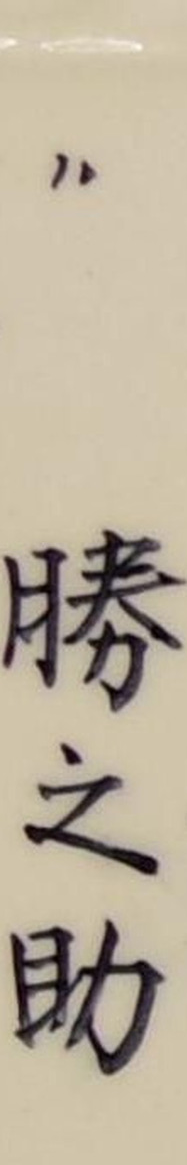勝之助
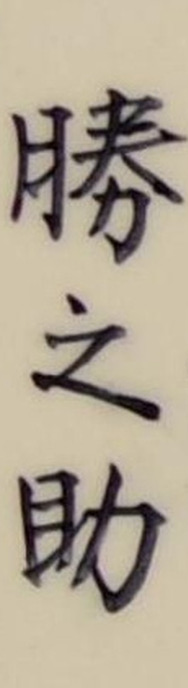勝之助
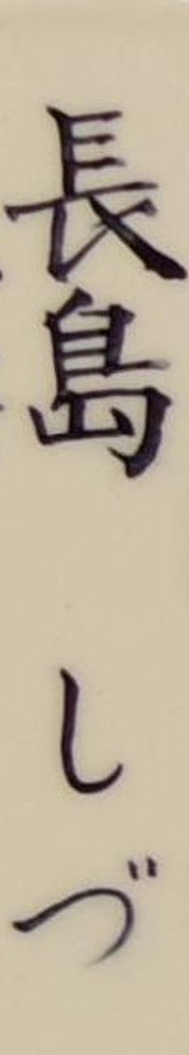長島しづ
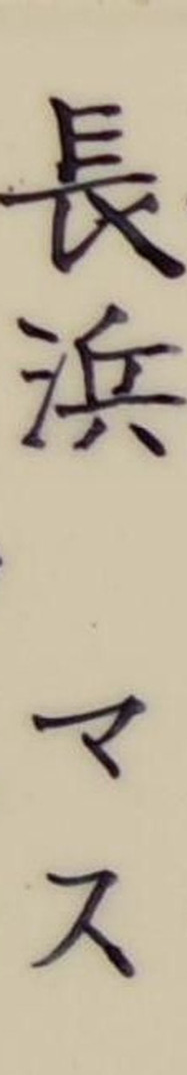長浜マス
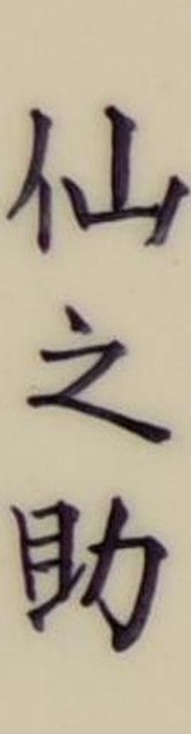仙之助
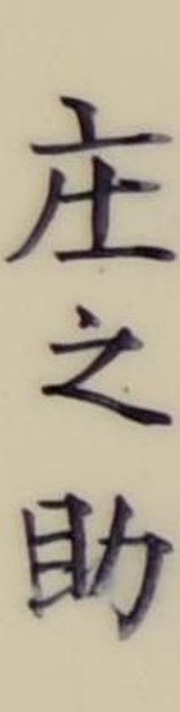庄之助
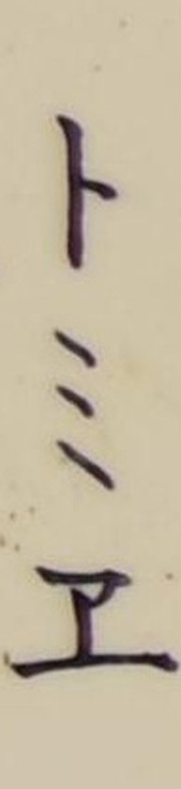トミエ
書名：E~L
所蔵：高野山金剛峯寺
